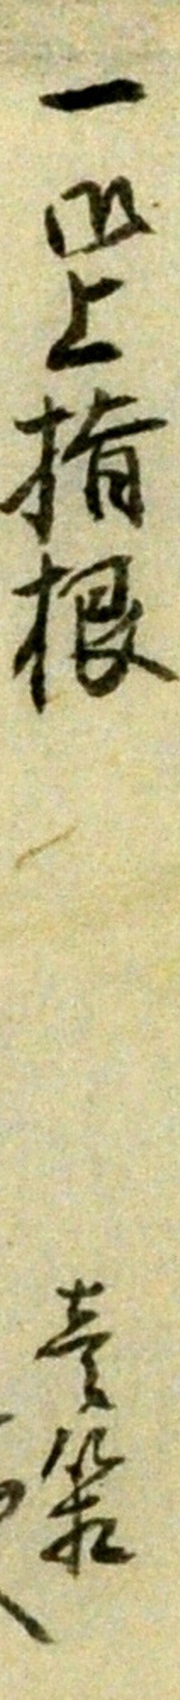一御上指根壱箱
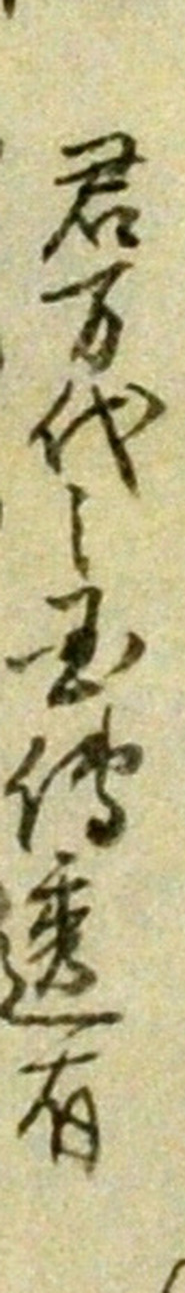但君万代之国伝透有
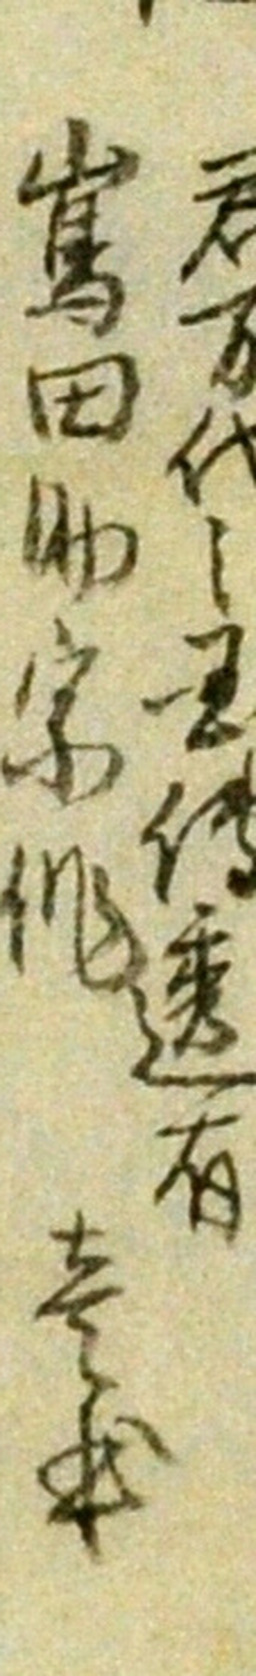嶋田助宗作壱本
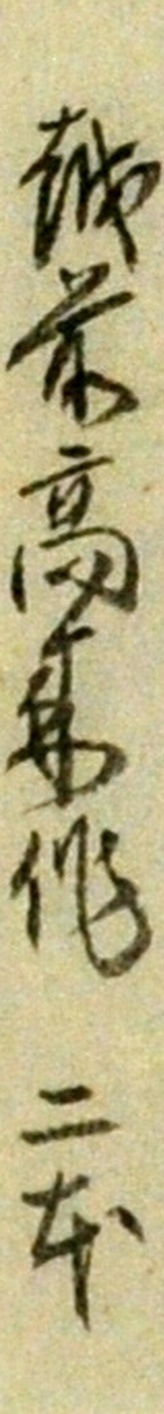越前高来作二本
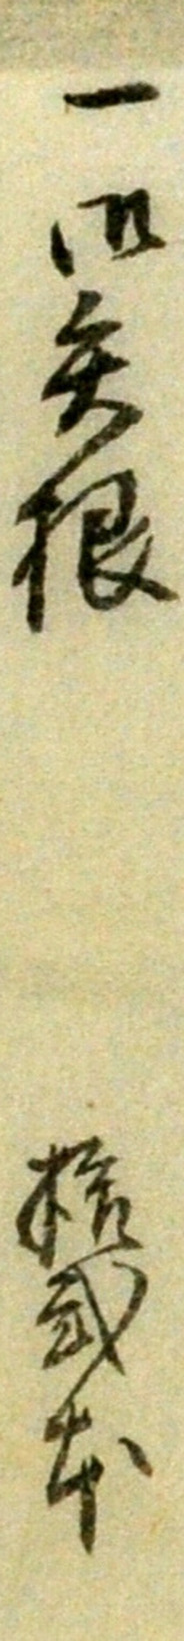一御矢根拾弐本
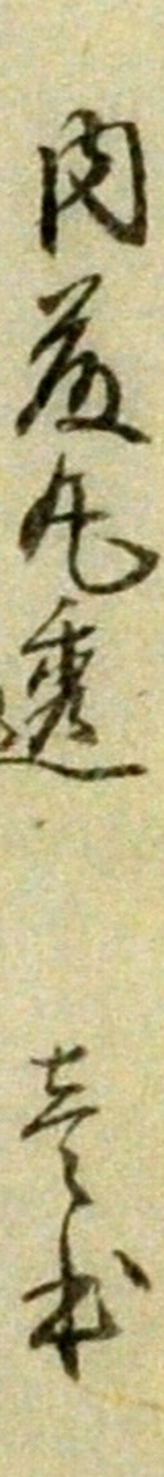内藤丸透壱本
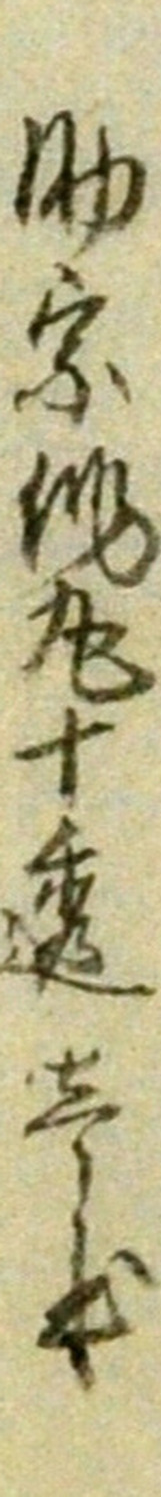助宗作丸十透壱本
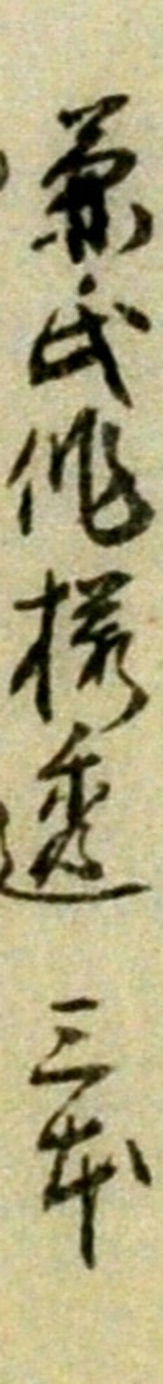兼氏作揃透三本
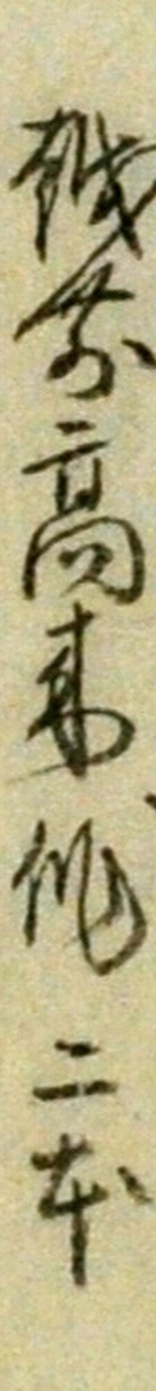越前高来作二本
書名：目録
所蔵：伊那市立高遠町図書館・合同会社AMANE
